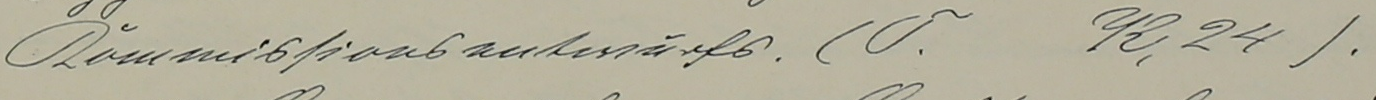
Kommissionsentwurfs. (T. K.24).
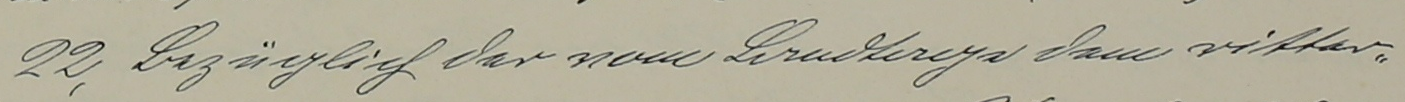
22. Bezüglich der vom Landtage dem ritter-
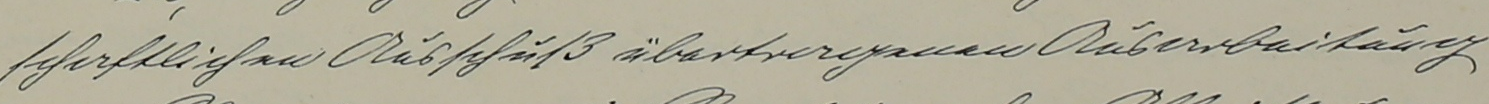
schaftlichen Ausschuß übertragenen Ausarbeitung
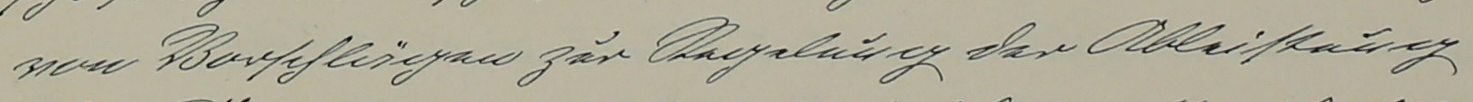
von Vorschlägen zur Regelung der Ableistung
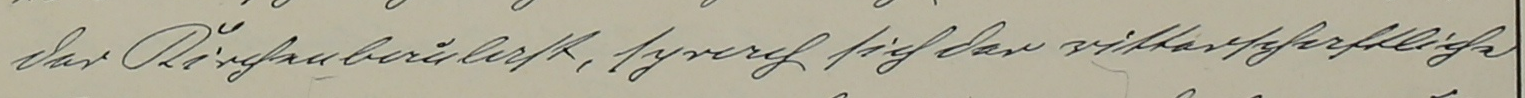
der Kirchenbaulast, sprach sich der ritterschaftliche
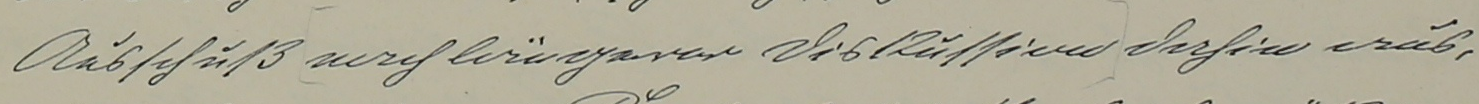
Ausschuß nach längerer Diskussion dahin aus,
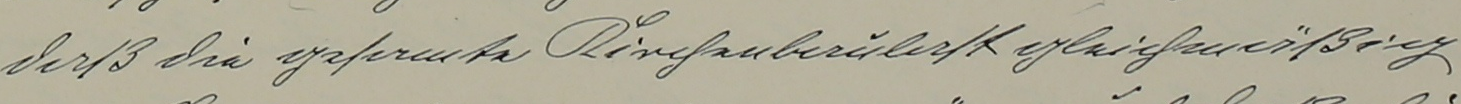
daß die gesamte Kirchenbaulast gleichmäßig
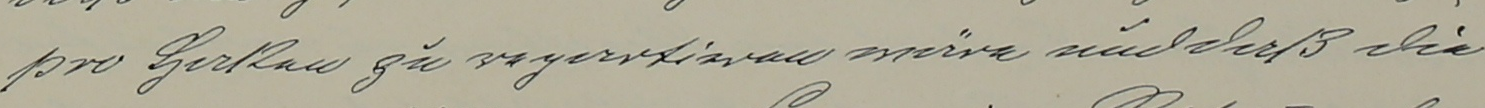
pro Haken zu repartieren wäre und daß die
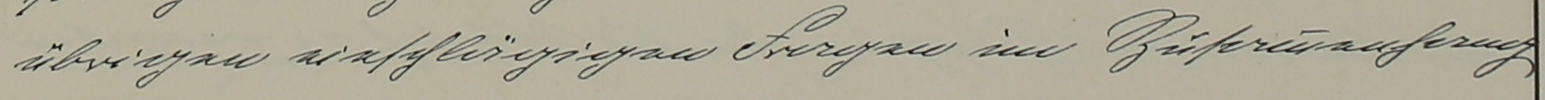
übrigen einschlägigen Fragen im Zusammenhang
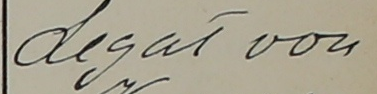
Legat von
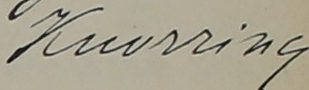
Knorring
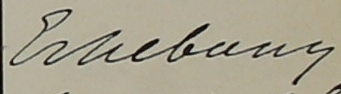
Erhebung
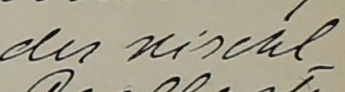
der kirchl
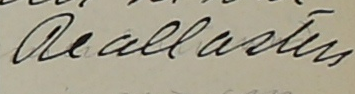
Reallasten
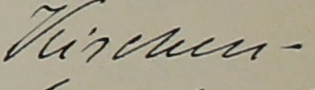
Kirchen-
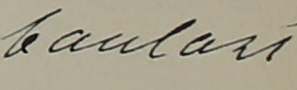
baulast
